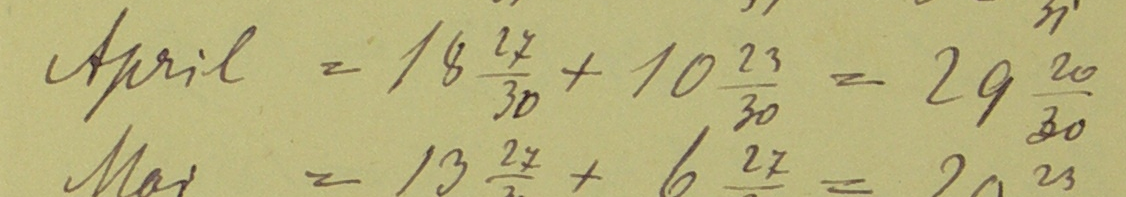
April = 18 27/30 + 10 23/30 = 29 20/30
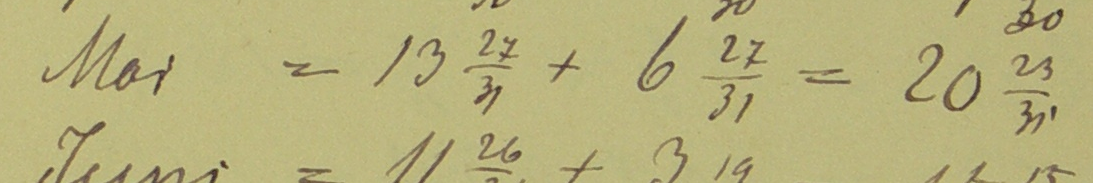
Mai = 13 27/31 + 6 27/31 = 20 23/31
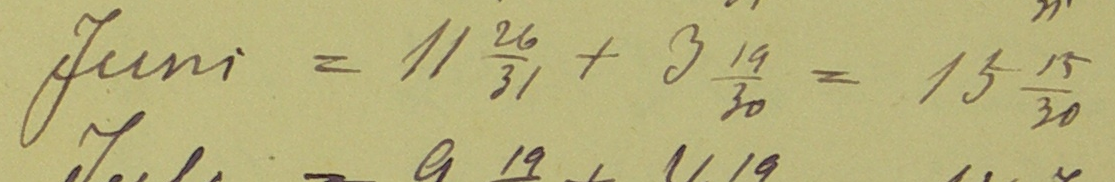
Juni = 11 26/31 + 3 19/30 = 15 15/30
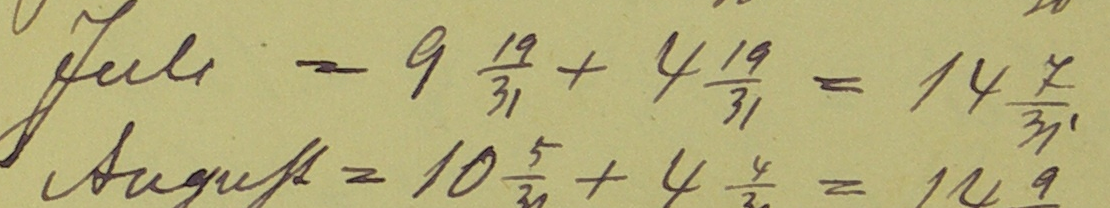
Juli = 9 19/31 + 4 19/31 = 14 7/31
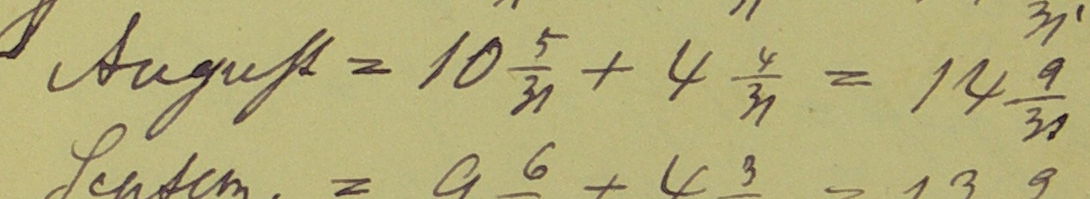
August = 10 5/31 + 4 4/31 = 14 9/30
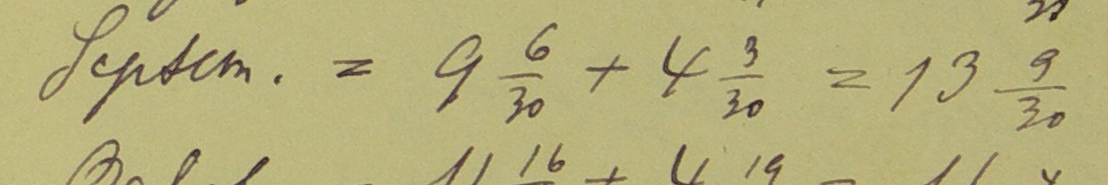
Septem. = 9 6/30 + 4 3/30 = 13 9/30
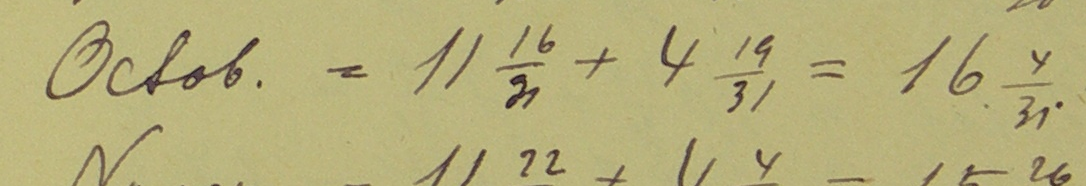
Octob. = 11 22/30 + 4 19/31 = 16 4/41
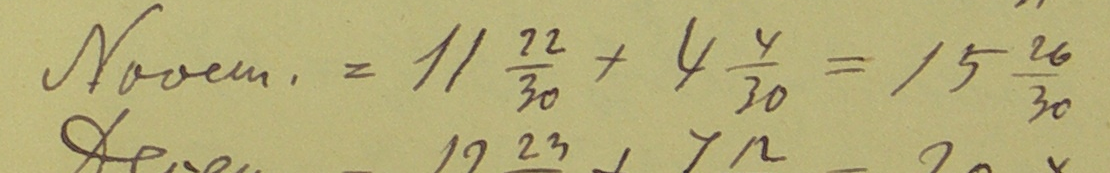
Novem. = 11 22/30 + 4 4/30 = 15 26/30
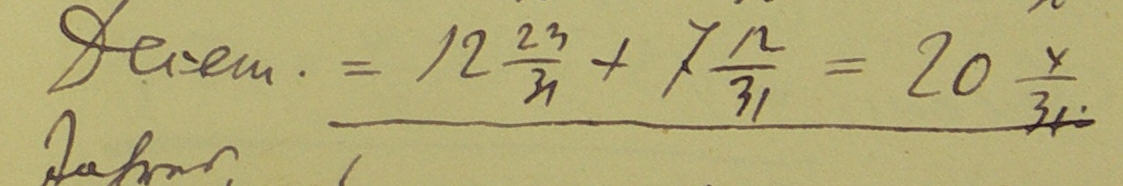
Decem. = 12 33/31 + 7 12/31 = 20 4/31
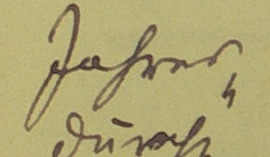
Jahres¬
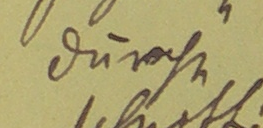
durch¬
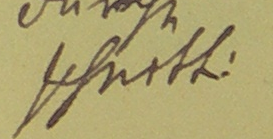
schnitt:
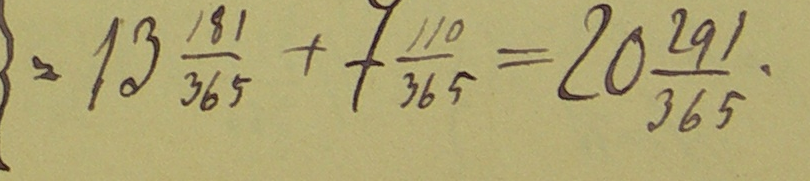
= 13 181/365 + 7 110/365 = 20 291/365
